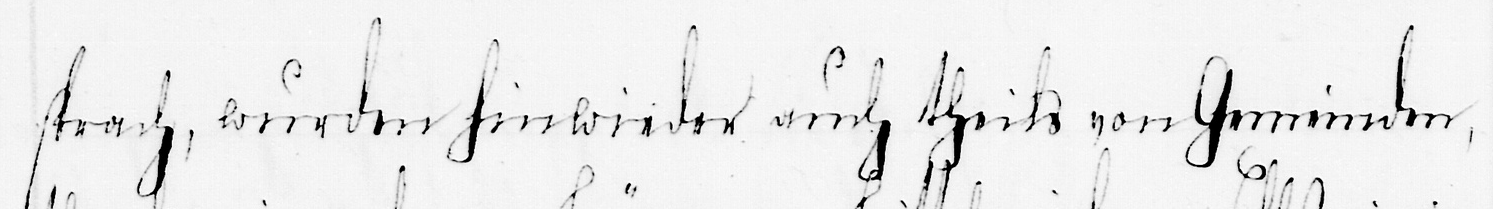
sprach, wurden hinwieder auch theils von Gemeinden,
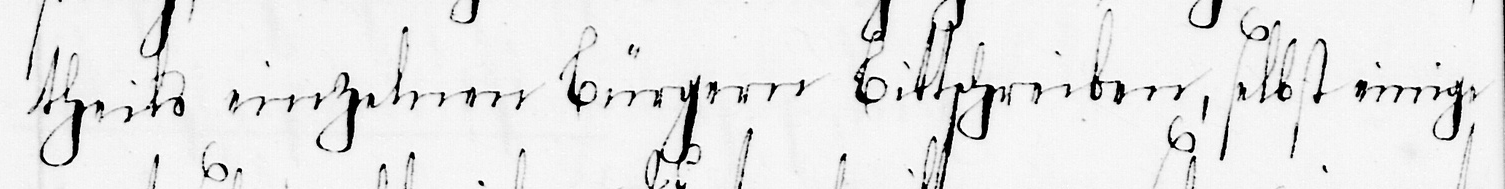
theils einzelnen Bürgern Bittschreiben, selbst einige
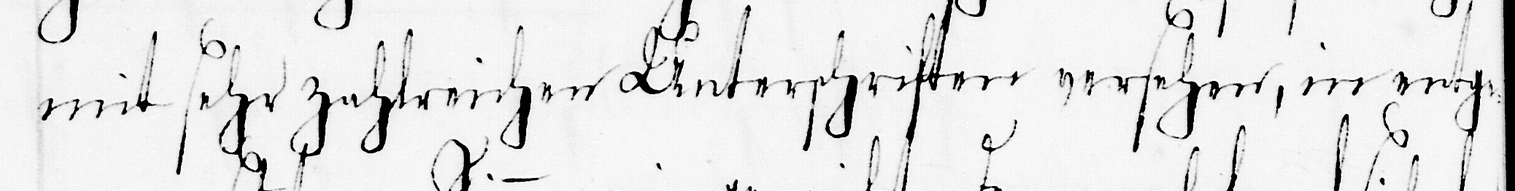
mit sehr zahlreichen Unterschriften versehen, in entg¬
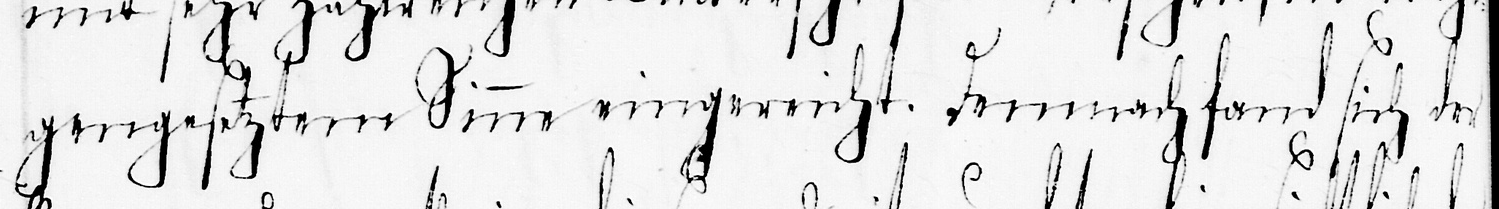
egengesetztem Sinne eingereicht. Demnach fand sich der
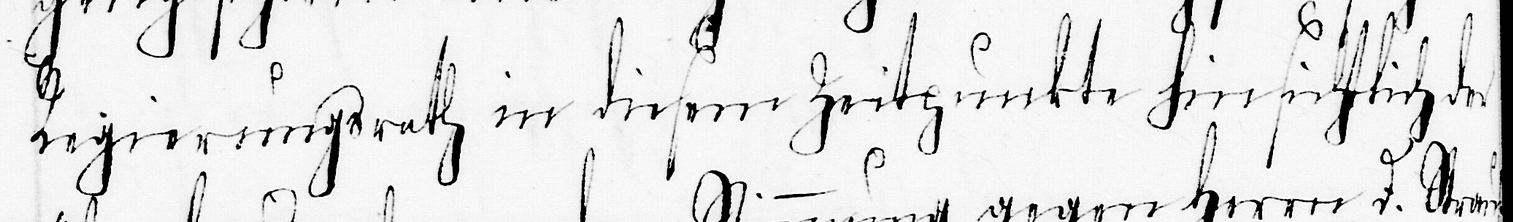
Regierungsrath in diesem Zeitpunkte hinsichtlich der
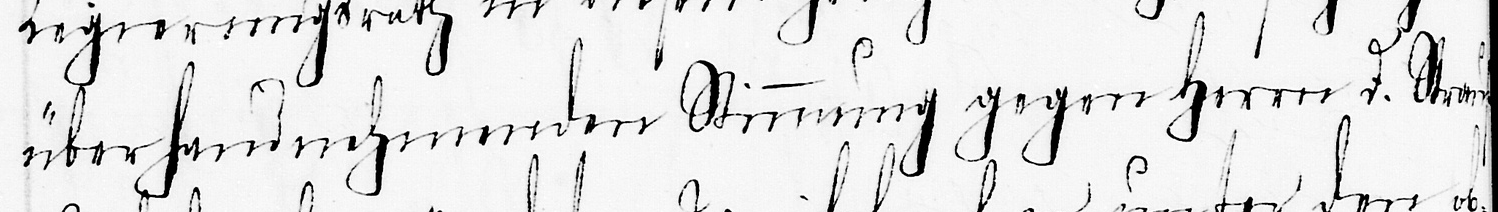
überhandnehmenden Stimmung gegen Herrn D. Stra¬
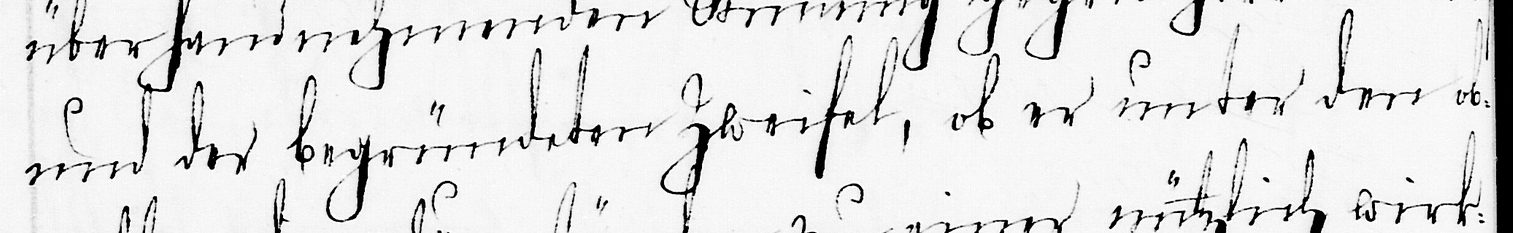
und der begründeten Zweifel, ob er unter den ob¬
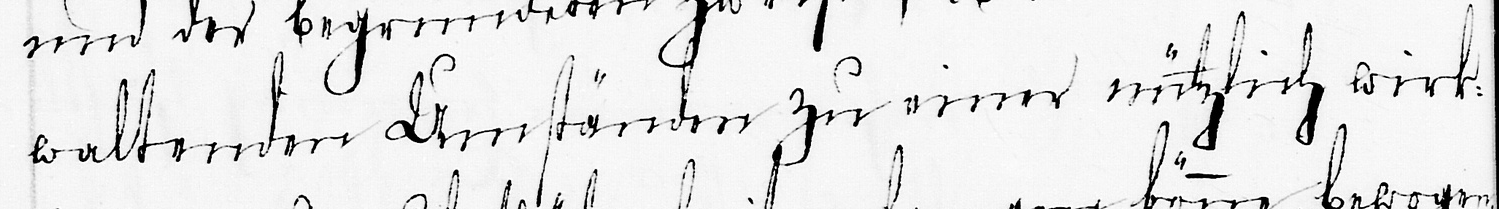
waltenden Umständen zu einer nützlich wirk¬
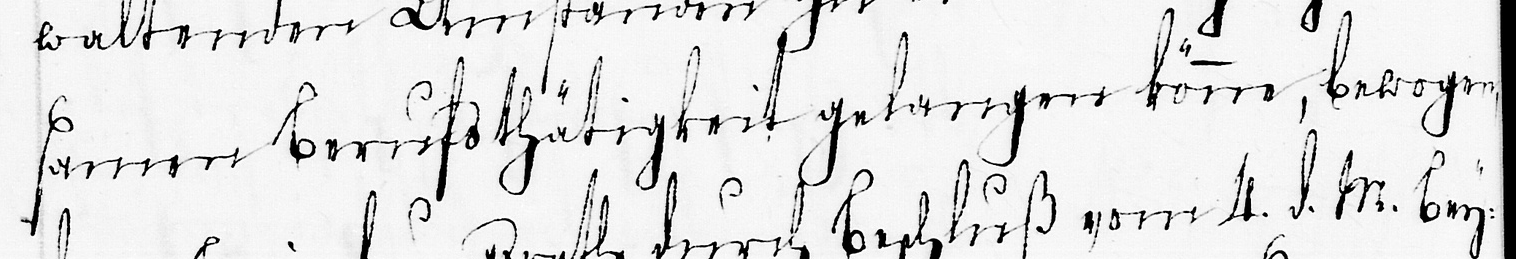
samen Berufsthätigkeit gelangen könne, bewogen,
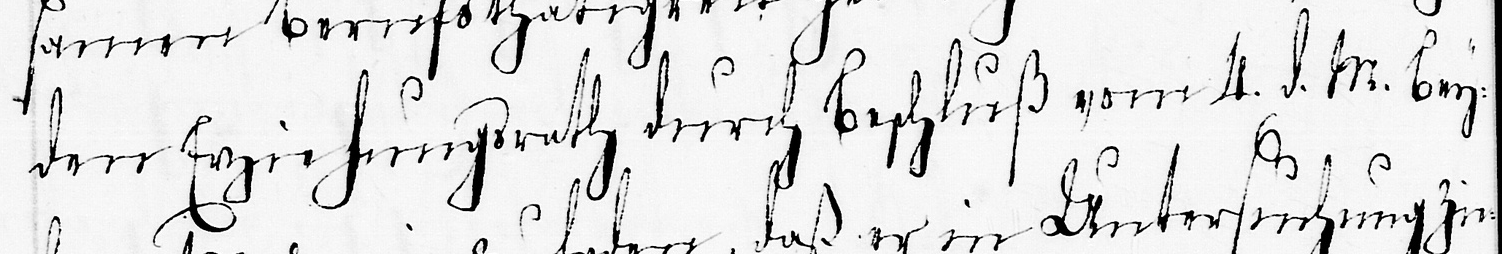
den Erziehungsrath durch Beschluß vom 4. d. M. Be¬
